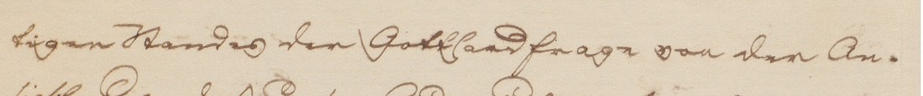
tigen Standes der Gotthardfrage von der An-
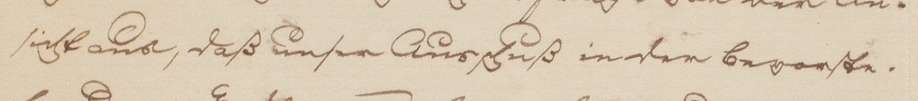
sicht aus, daß unser Ausschuß in der bevorste-
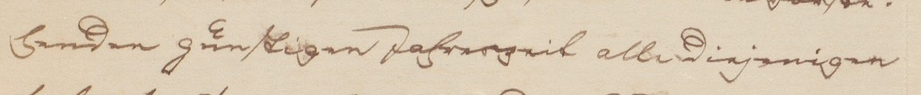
henden günstigen Jahreszeit alle diejenigen
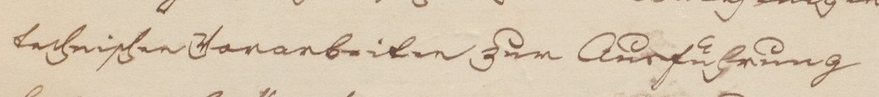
technischen Vorarbeiten zur Ausführung
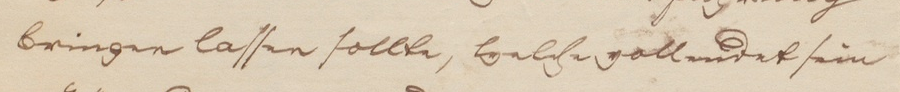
bringen lassen sollte, welche vollendet sein
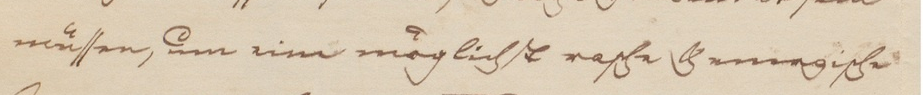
müssen, um eine möglichst rasche & energische
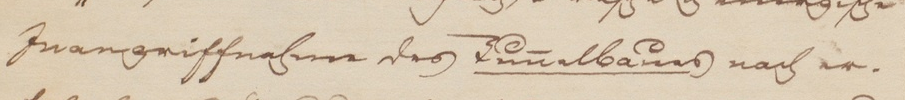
Inangriffnahme des Tunnelbaues nach er-
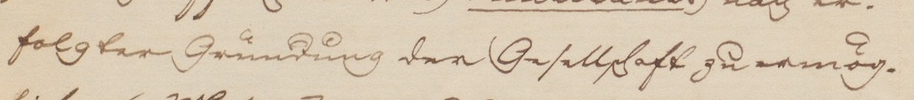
folgter Gründung der Gesellschaft zu ermög-
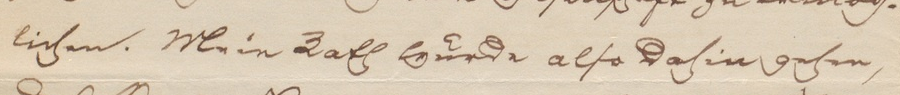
lichen. Mein Rath würde also dahin gehen,
